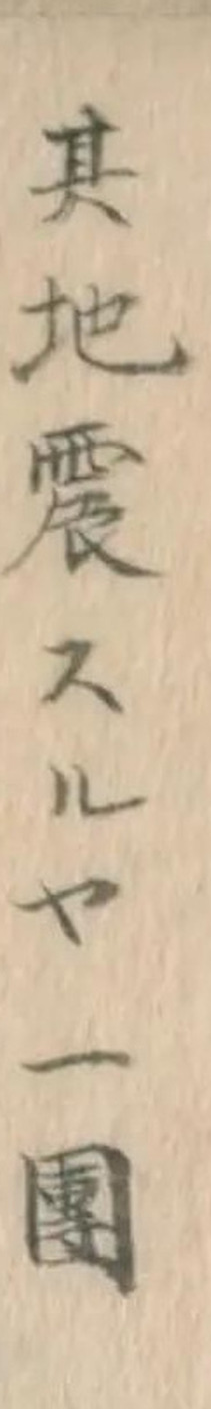其地震スルヤ一団
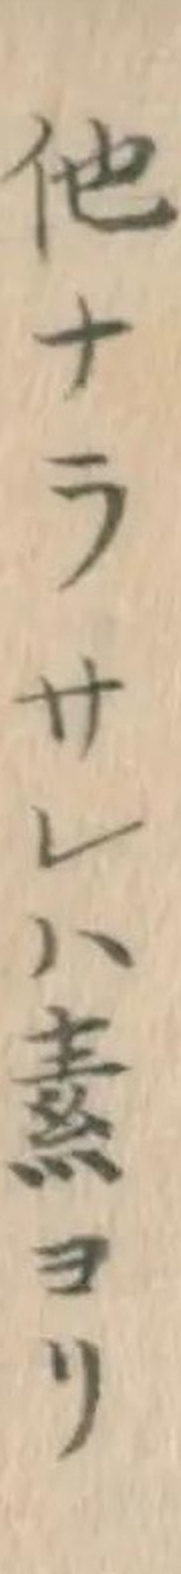他ナラサレハ素ヨリ
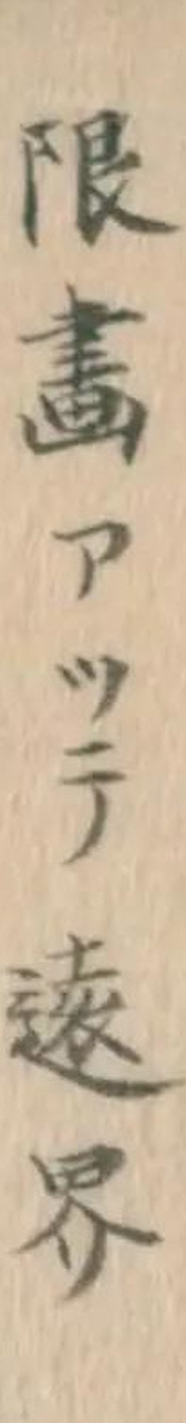限画アツテ遠界
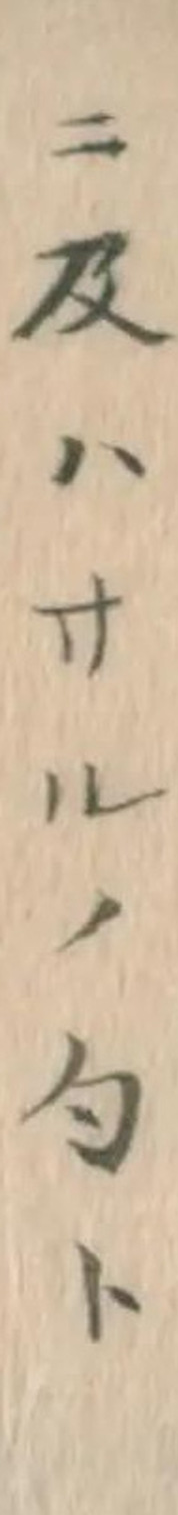ニ及ハサルノ勺ト
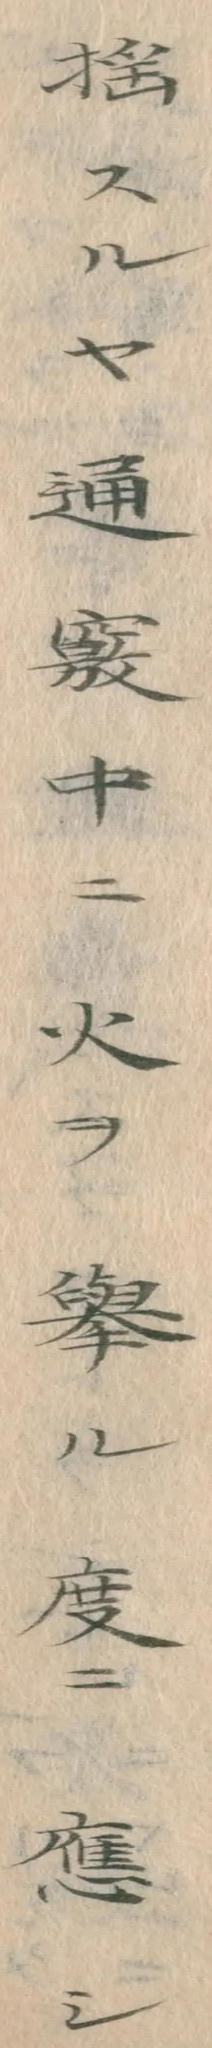遥スルヤ通竅中ニ火ヲ挙ル度ニ応シ
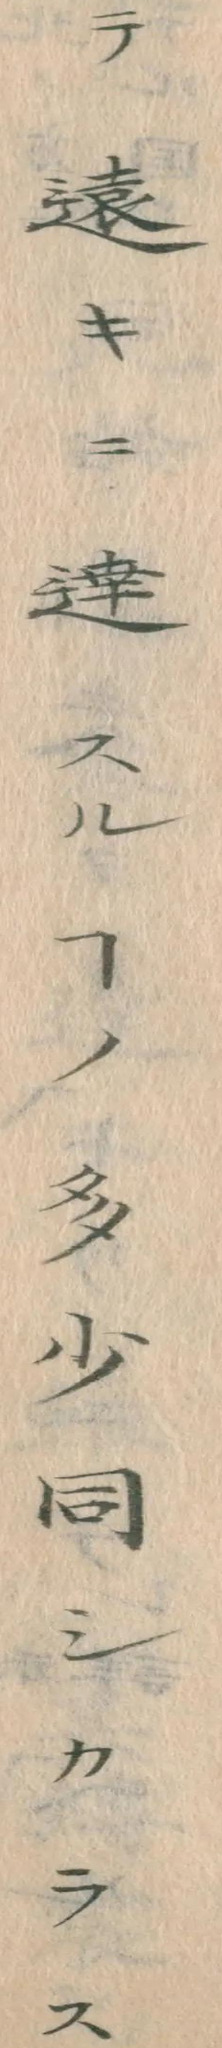テ遠キニ達スル事ノ多少同シカラス
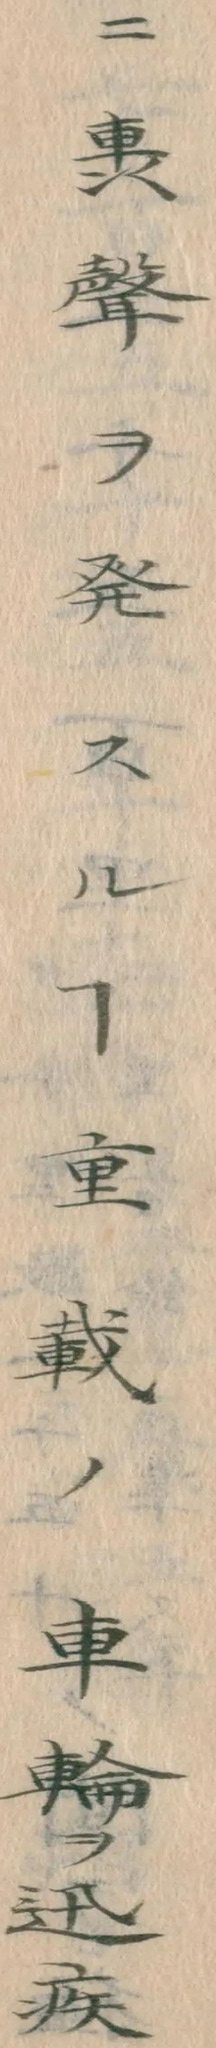ニ轟声ヲ発スル事重載ノ車輪ヲ迅疾
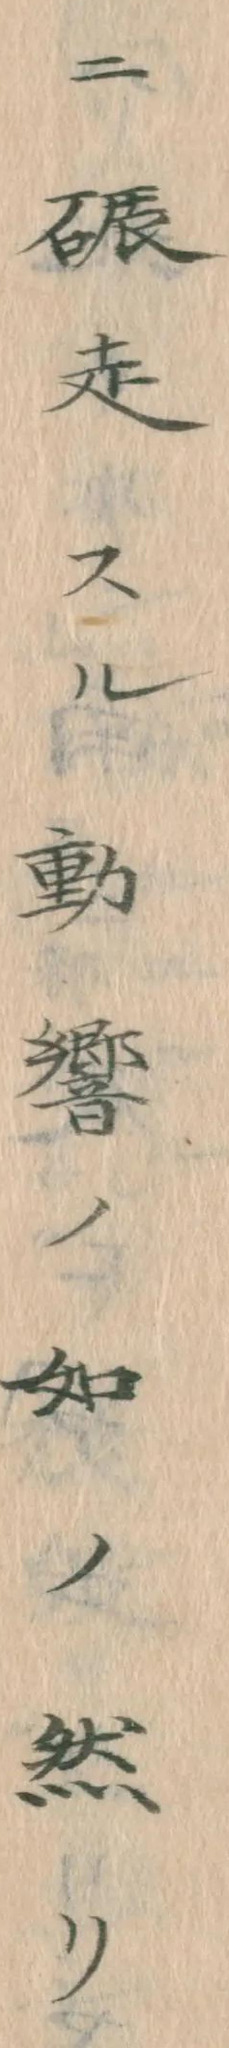ニ走スル動響ノ如ノ然リ
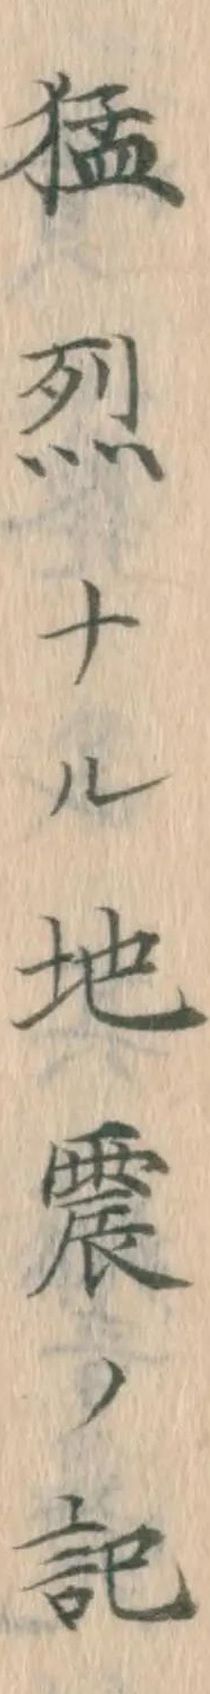猛烈ナル地震ノ記
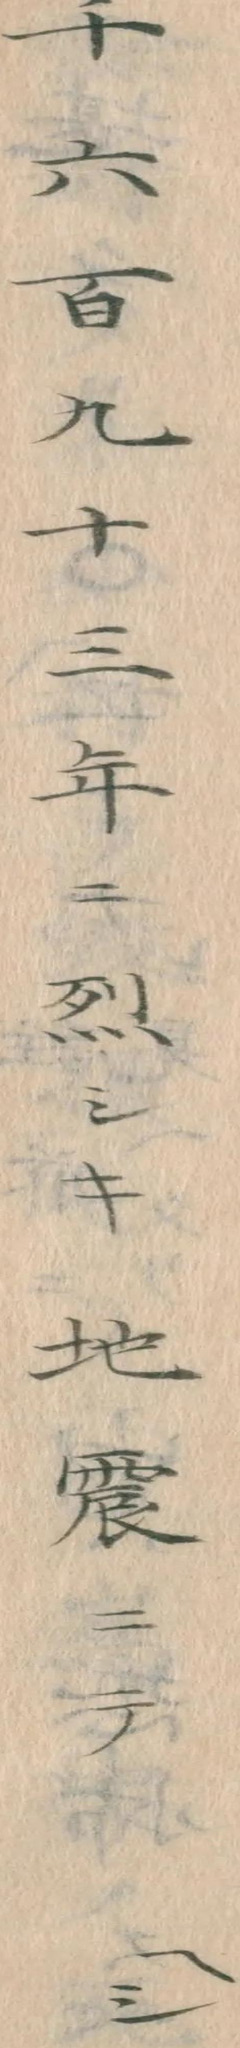千六百九十三年ニ烈シキ地震ニテ「シ
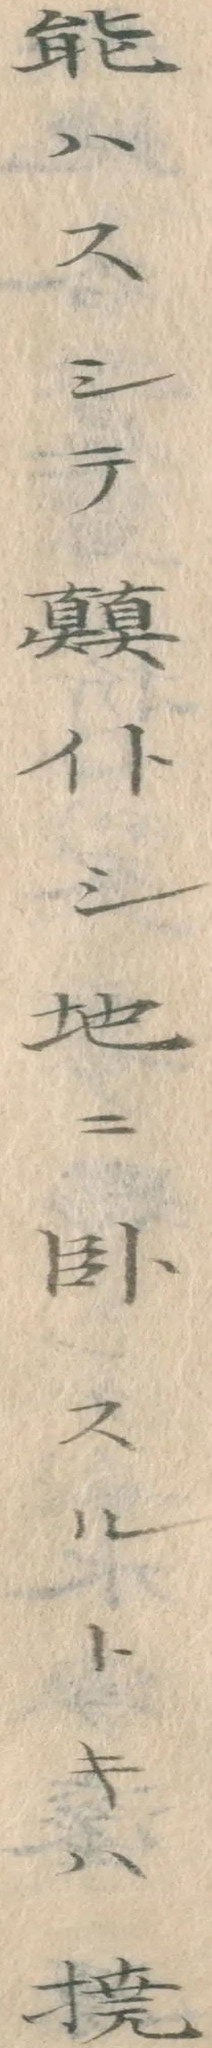能ハスシテ仆シ地ニスルトキハ撓
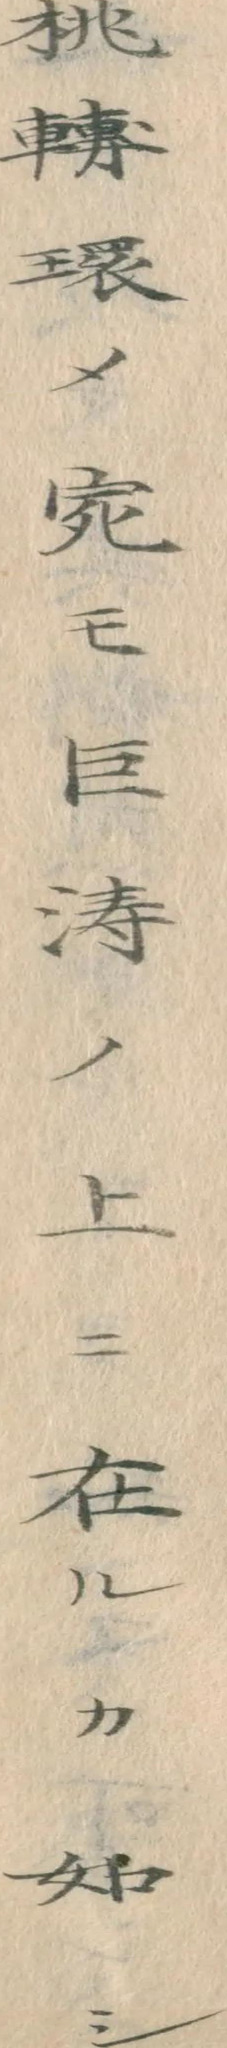桃転環ノモ巨涛ノ上ニ在ルカ如シ

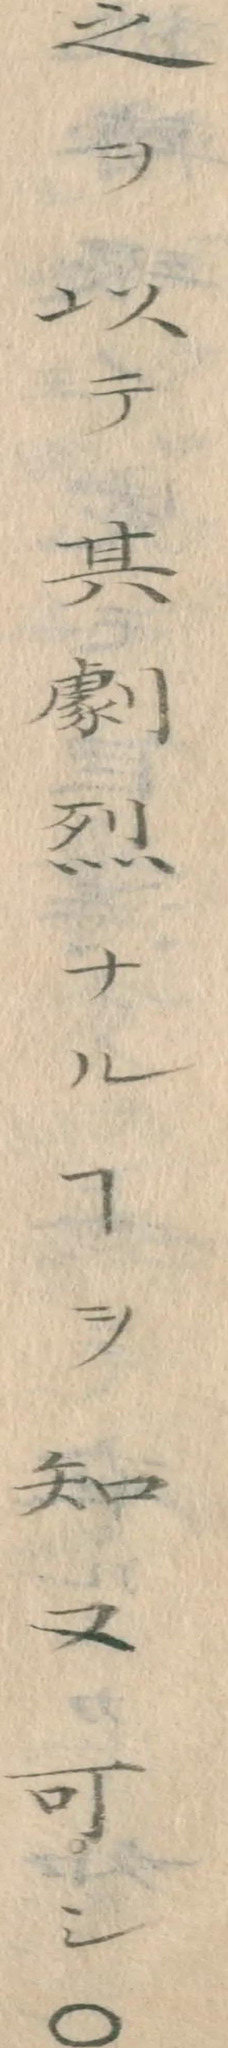之ヲ以テ其劇烈ナル事ヲ知ヌ可シ○
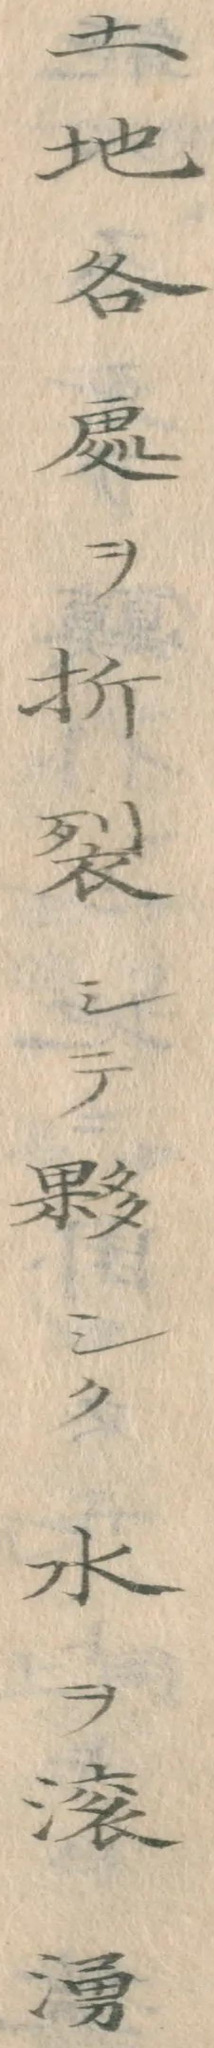土地各処ヲ折裂シテ夥シク水ヲ滚湧
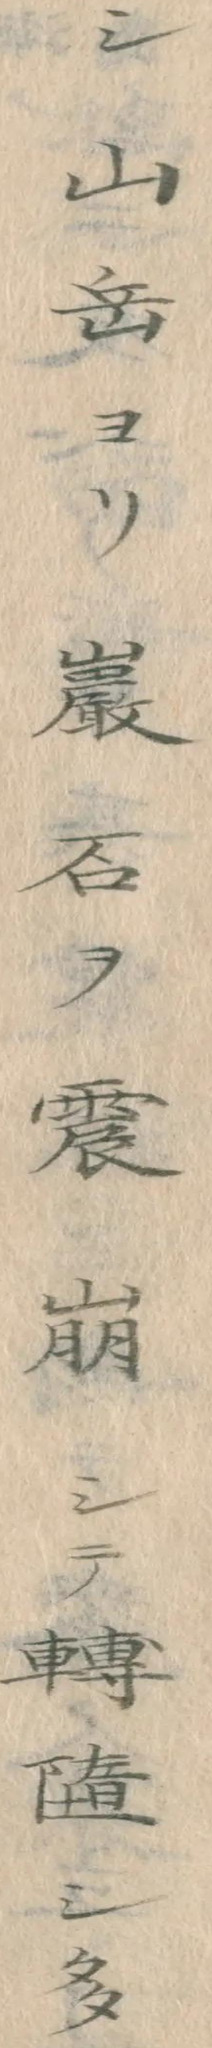シ山岳ヨリ巌石ヲ震崩シテ転隨シ多
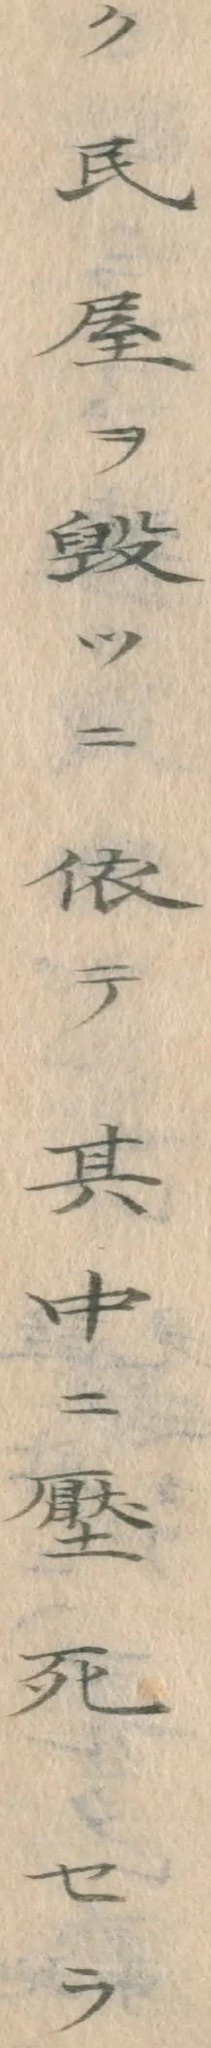ク民屋ヲ毀ツニ依テ其中ニ圧死セラ
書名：輪池叢書. 12
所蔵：国立国会図書館 National Diet Library, JAPAN
